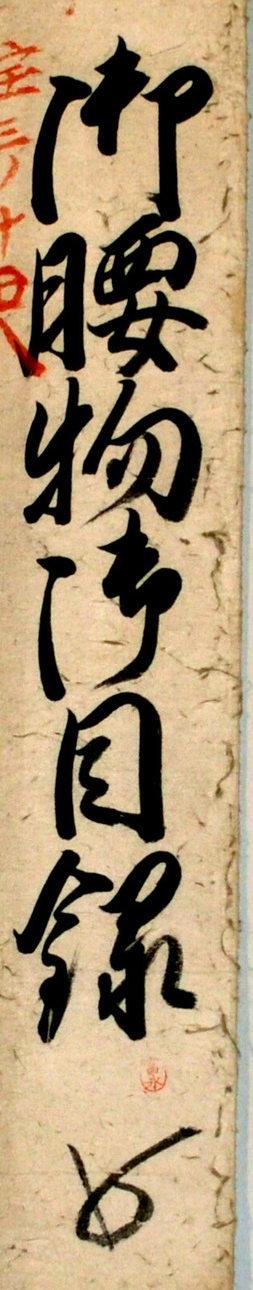御腰物御目録６

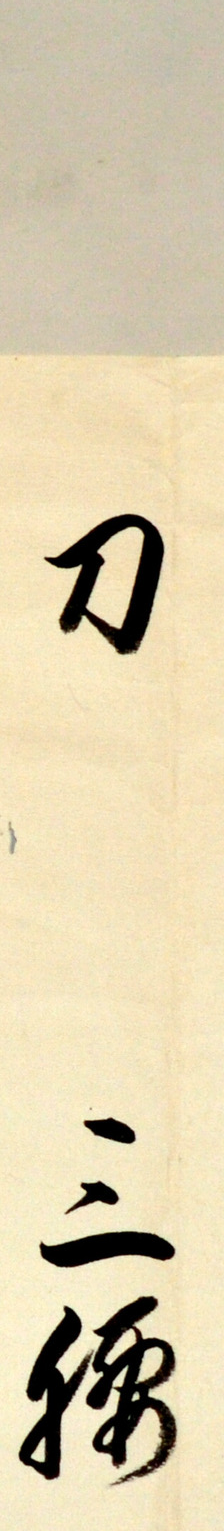刀三腰
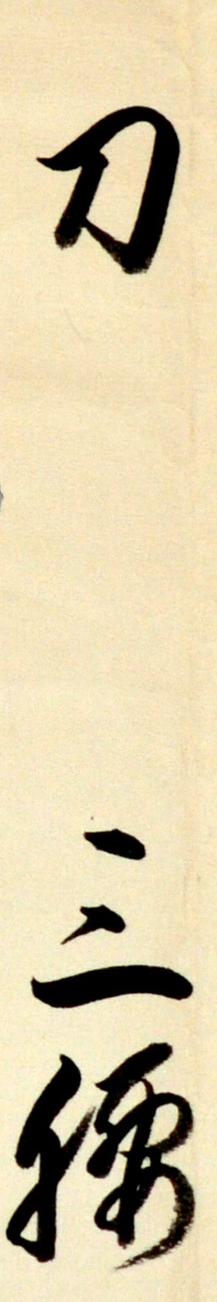刀三腰
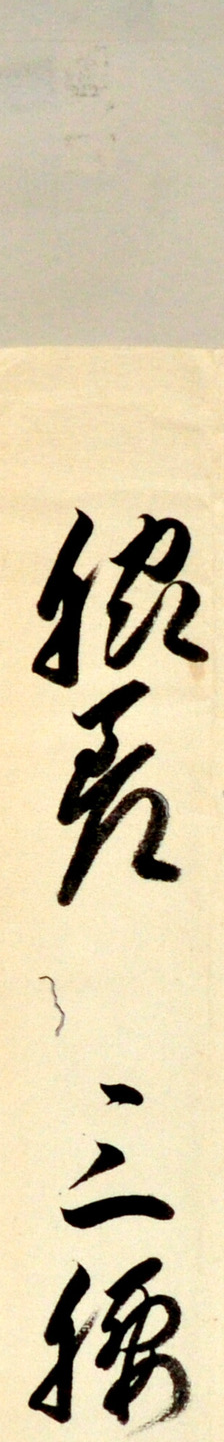脇差三腰
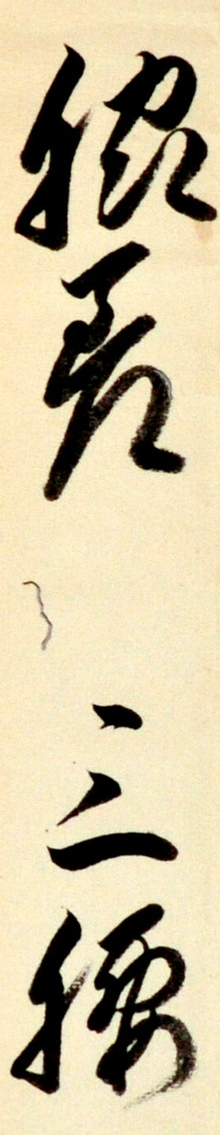脇差三腰
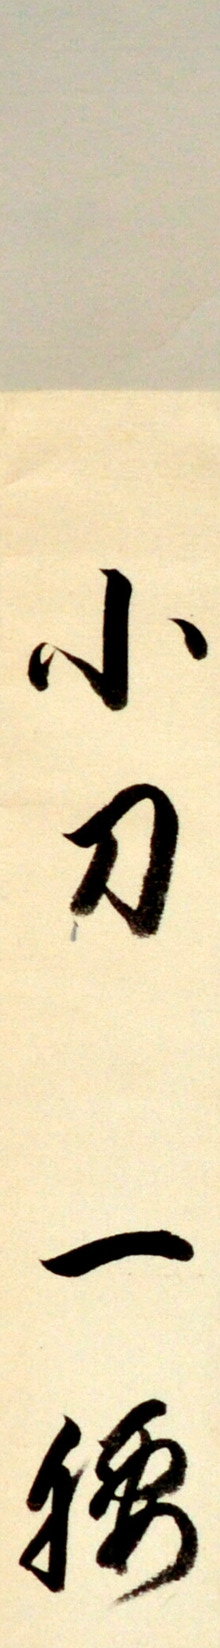小刀一腰
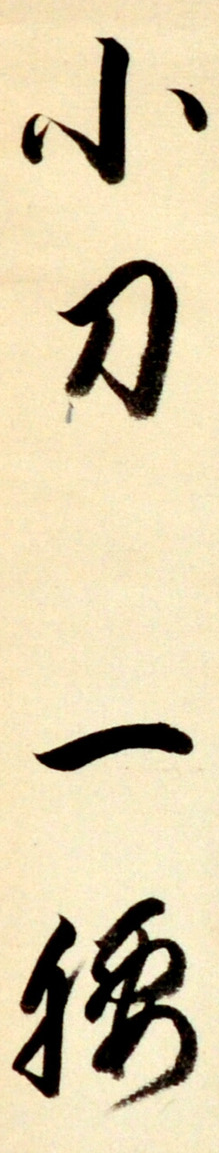小刀一腰
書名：御腰物御目録
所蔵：伊那市立高遠町図書館・合同会社AMANE
